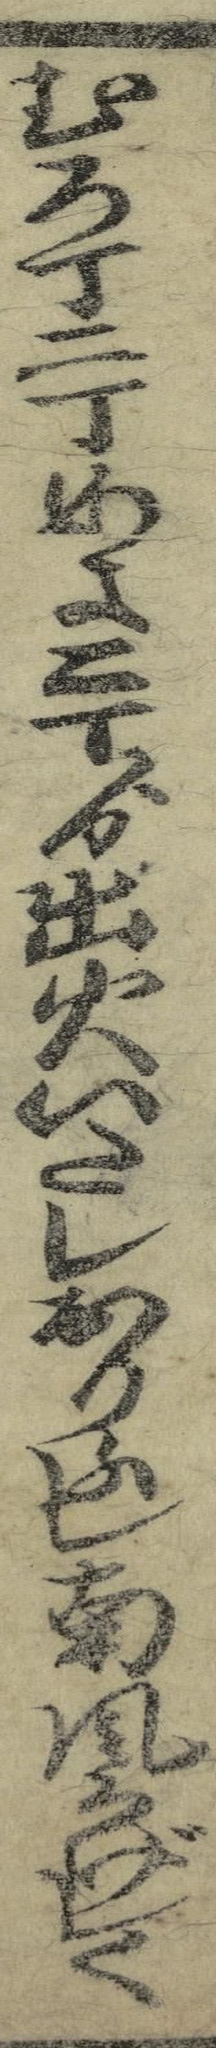むろ丁二丁めよこ丁ゟ出火いたしおりふし南風はげしく
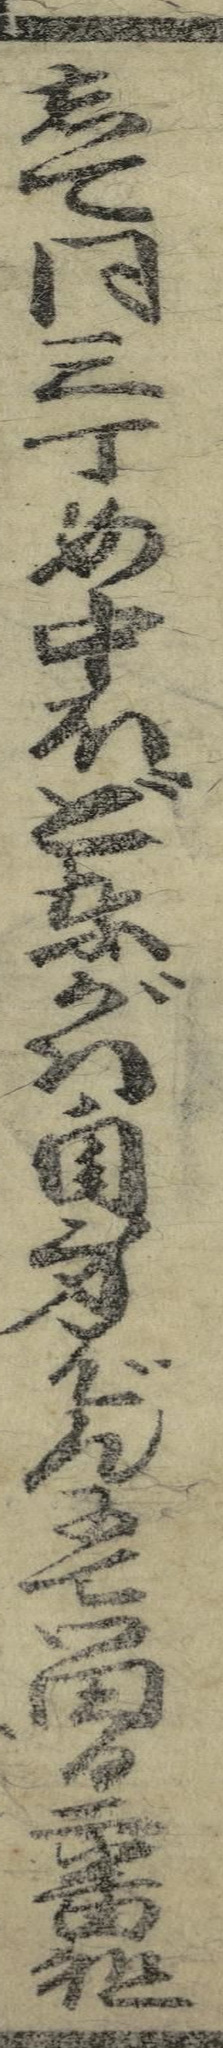して同三丁め中ほど東がは自身ばんにて留る二番組
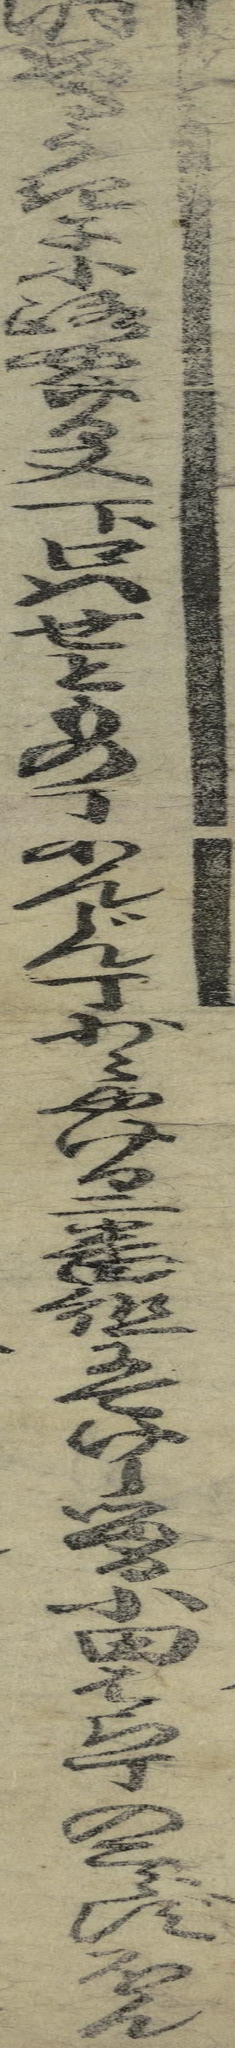消留るうきに小路やける又一ト口ハせともの丁てんじん丁少々やける二番組にてけし留る小田はら丁のこらずほん
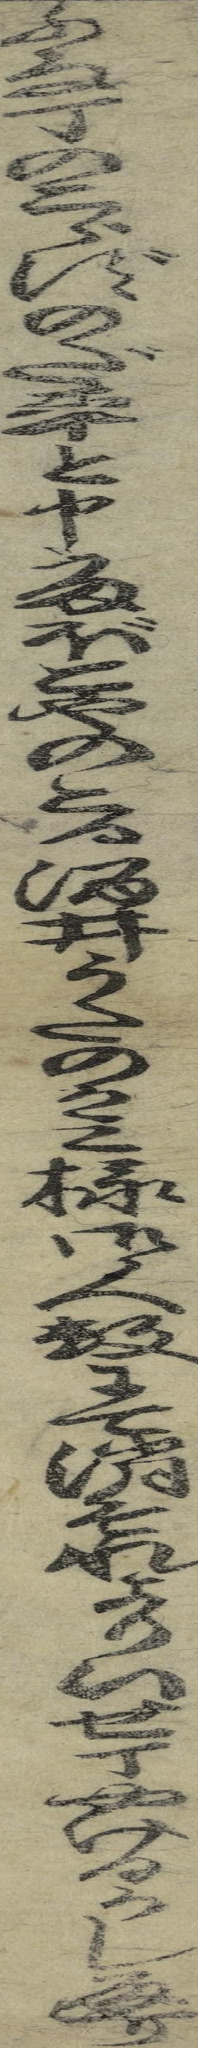ふね丁のこらずのだ平と申たばこやのこる酒井うたのかみ様御人数にて消それよりいせ丁やけるかし通り
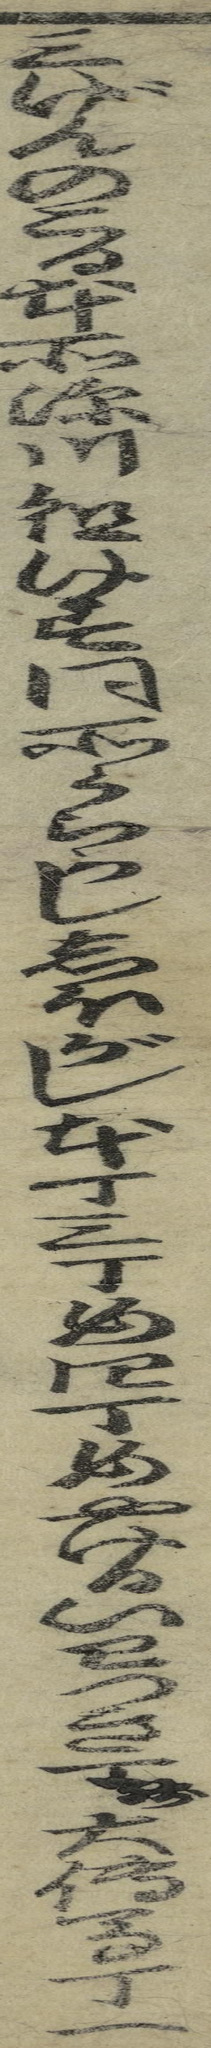三げんのこる本所深川組けす同所うらかししほがし本丁三丁め四丁めやけるいわつき丁大伝馬丁一
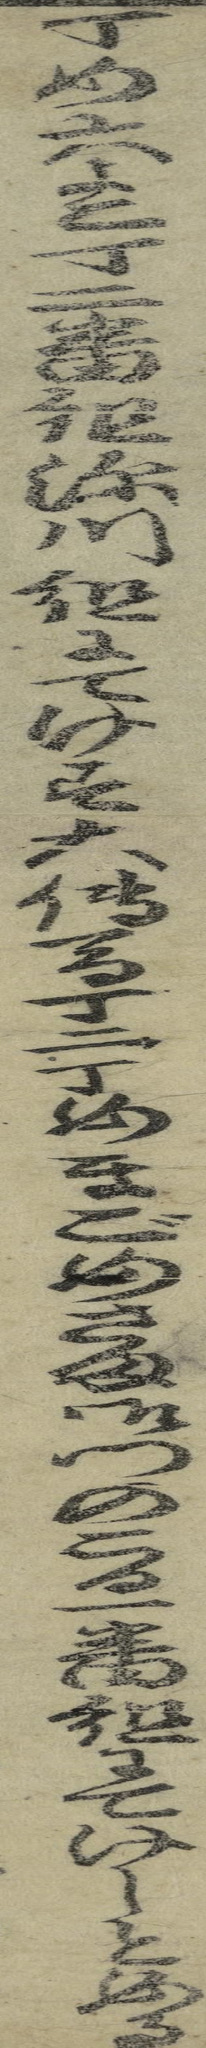丁め六よこ丁二番組深川組にてけす大伝馬丁二丁めまごめさま御門のこる一番組にてけしとめる
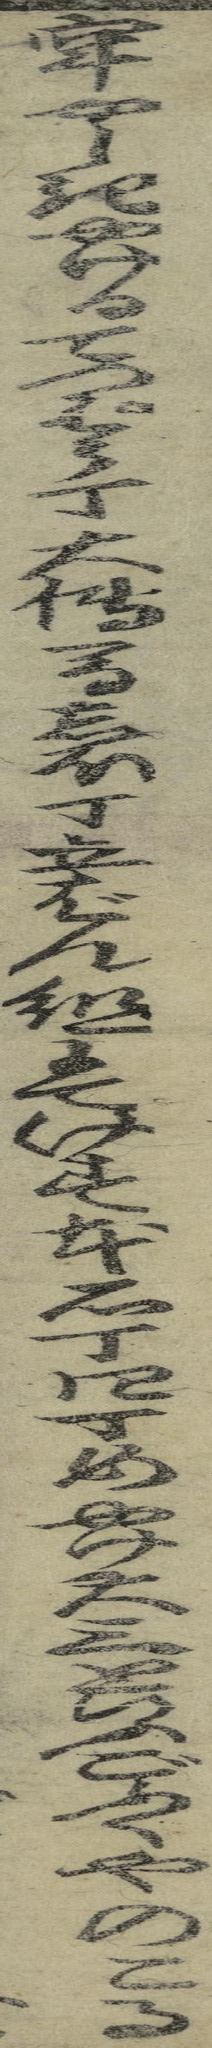牢やしきやけるてつぱう丁大伝馬しほ丁五ばん組にてけす本石丁四丁めやけ大三といふごふくやのこる
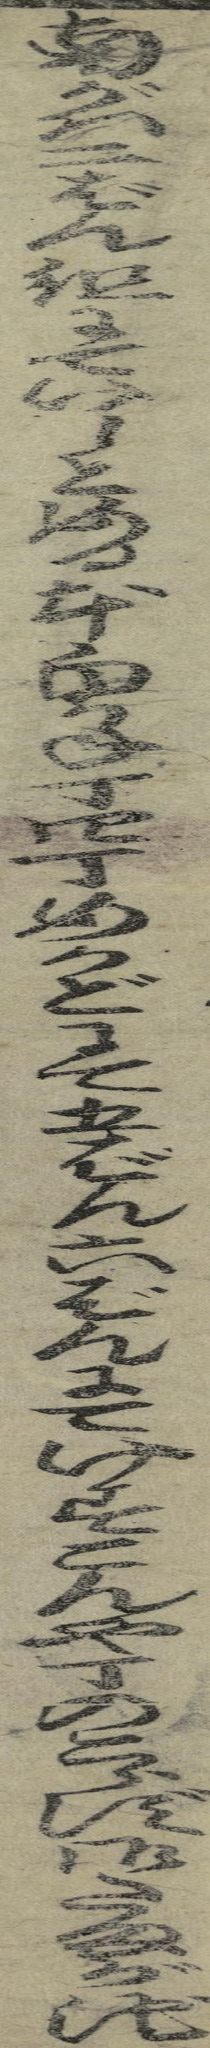南がハ二ばん組にてけしとめる本白かね丁四丁めかどにて五ばん六ばんにてけすこんや丁のこらず御たまが池
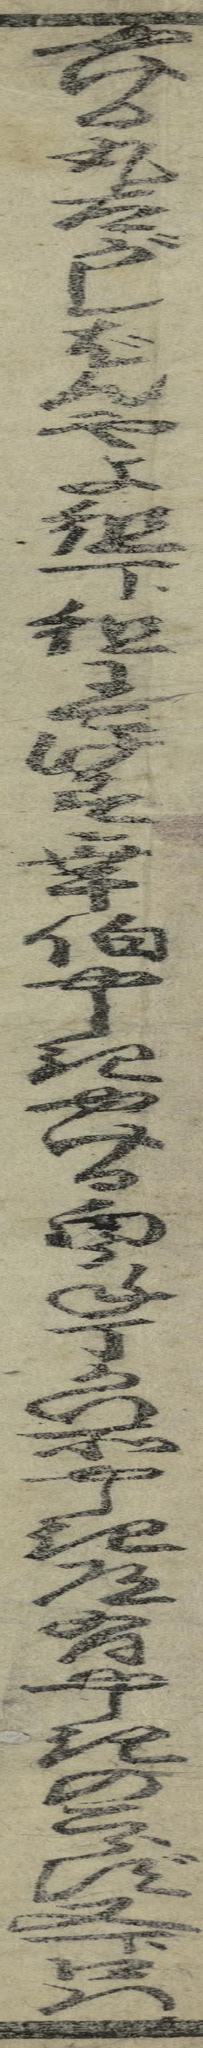やける丸たがしばんやよ組一ト組にてけす幸伯やしきやける白かね丁かい所やしき道有やしきのこらず又一ト口ハ
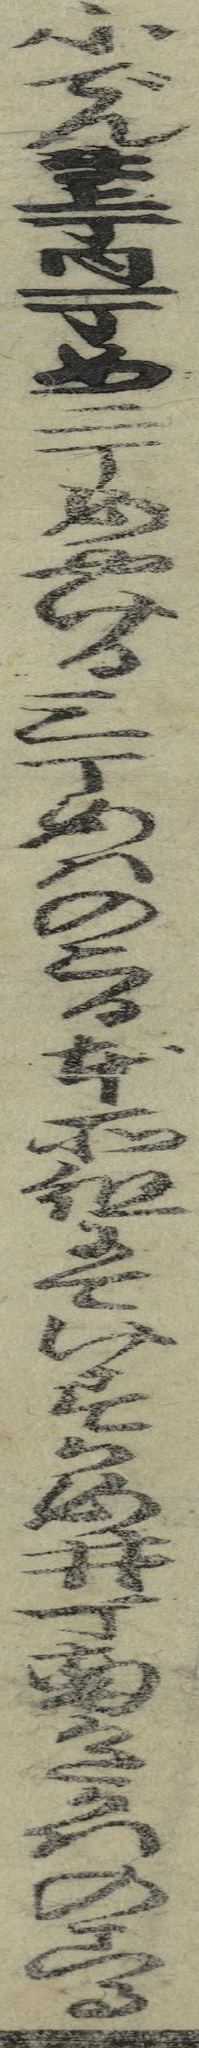小でんま上丁内一丁め二丁めやける三丁めハのこる本所組にてけすかめ井丁南辺かたかハのこる
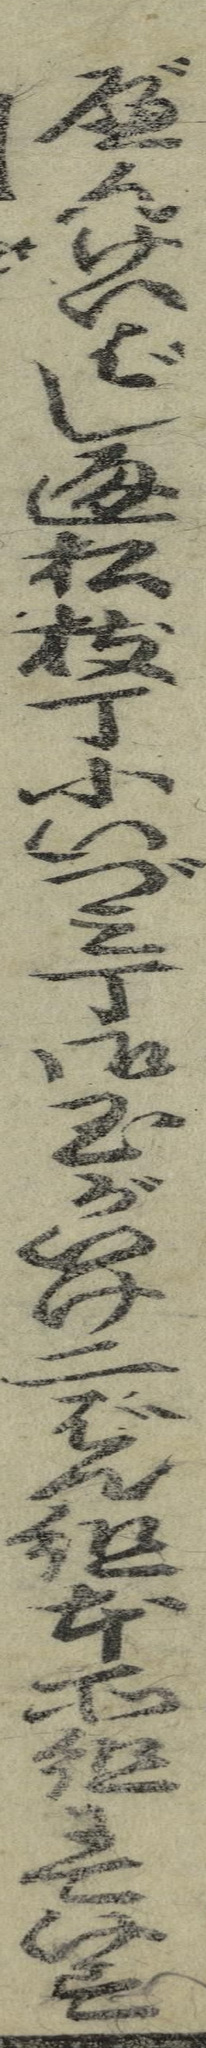べんけいばし通松枝丁小いづみ丁御玉がいけ二ばん組本所組にてけす
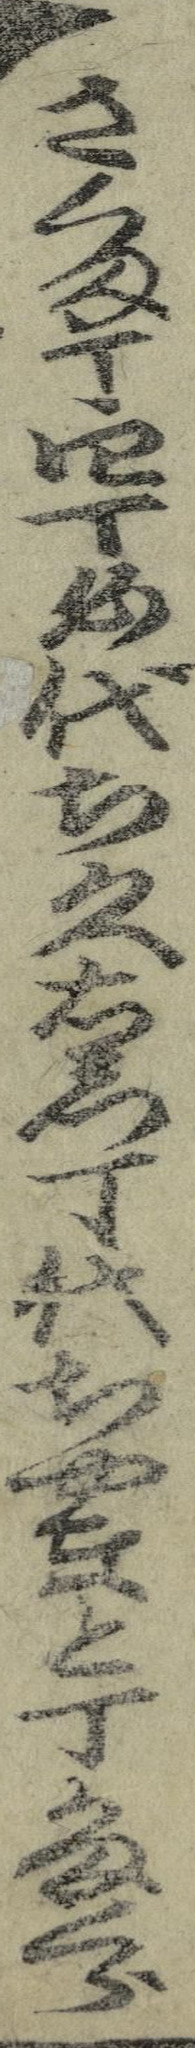さくま丁四丁め代ち久右衛門丁代ちやまと丁かまくら
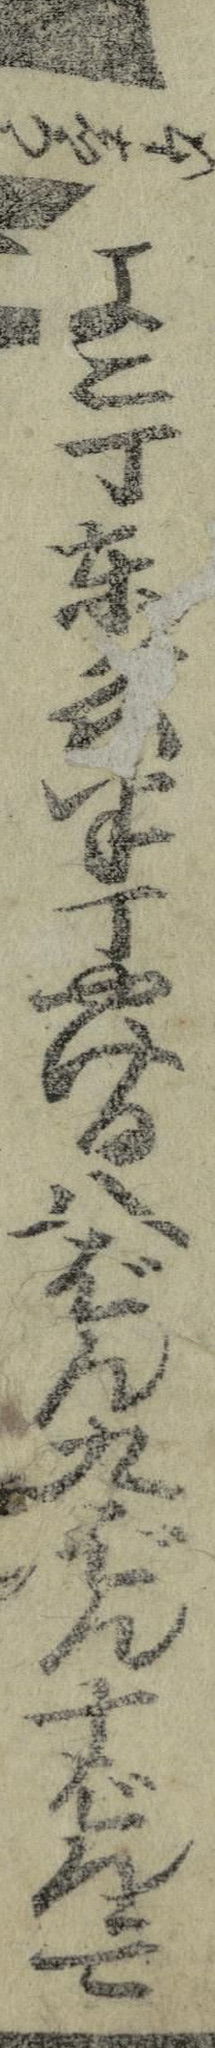よこ丁東かハ半丁やける八ばん九ばん十ばん二て◑
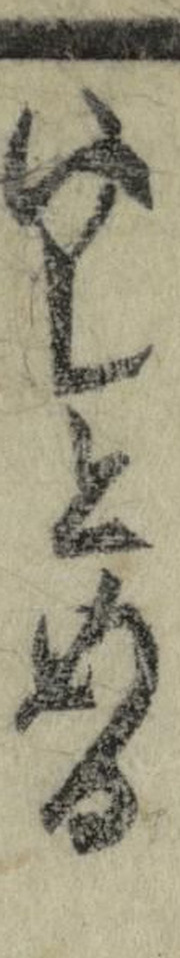けしとめる
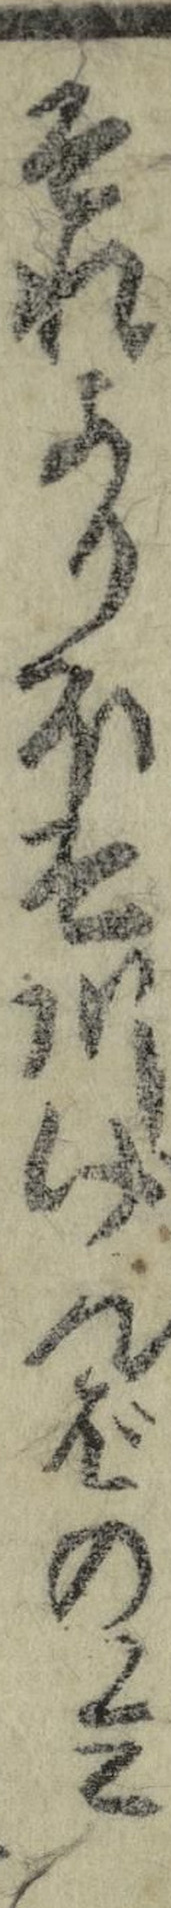それよりほそ川げんばのかミ
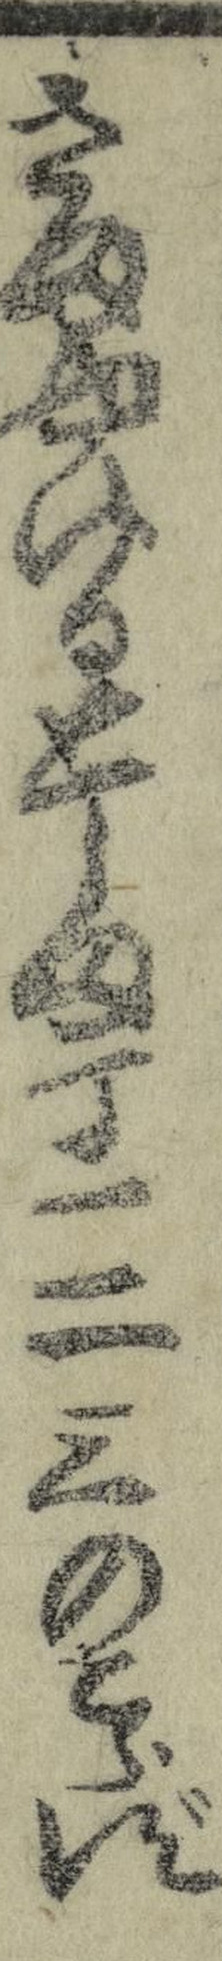さまやけるとしま丁一二三のこらず
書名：焼場方角附
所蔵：東京大学地震研究所図書室 Earthquake Research Institute Library, The University of Tokyo, JAPAN
